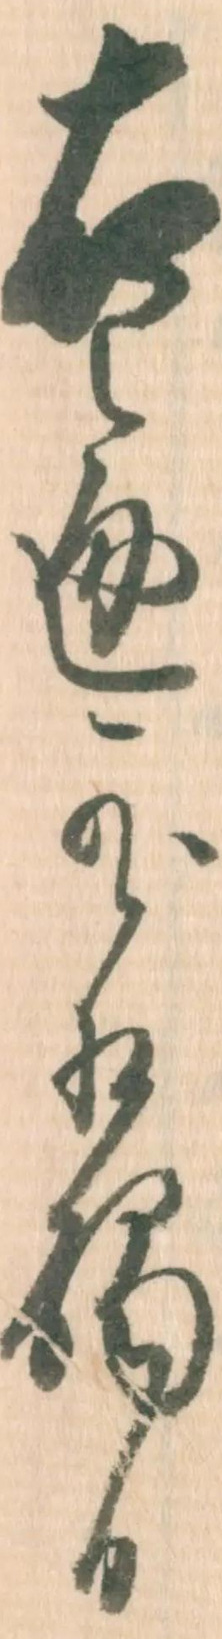右之通可被相触候
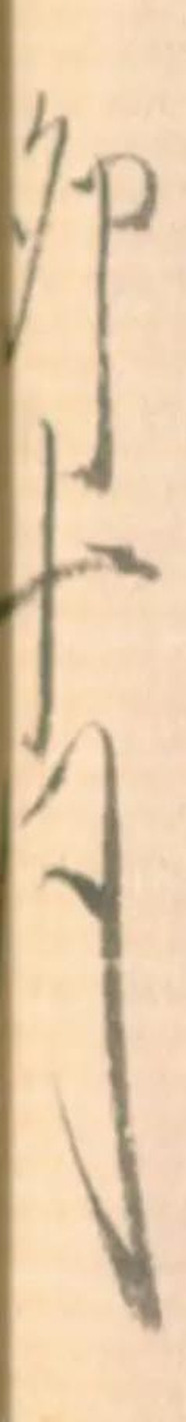卯十月
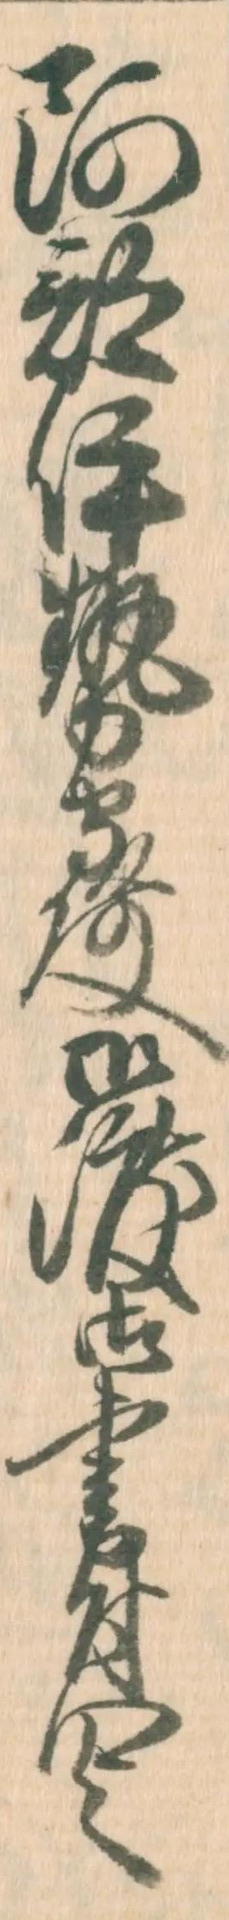│阿部伊勢守殿御渡御書付写
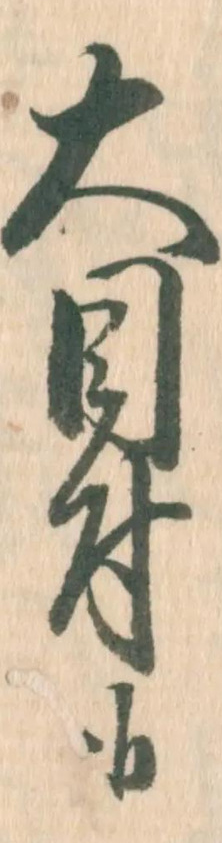│大目付え
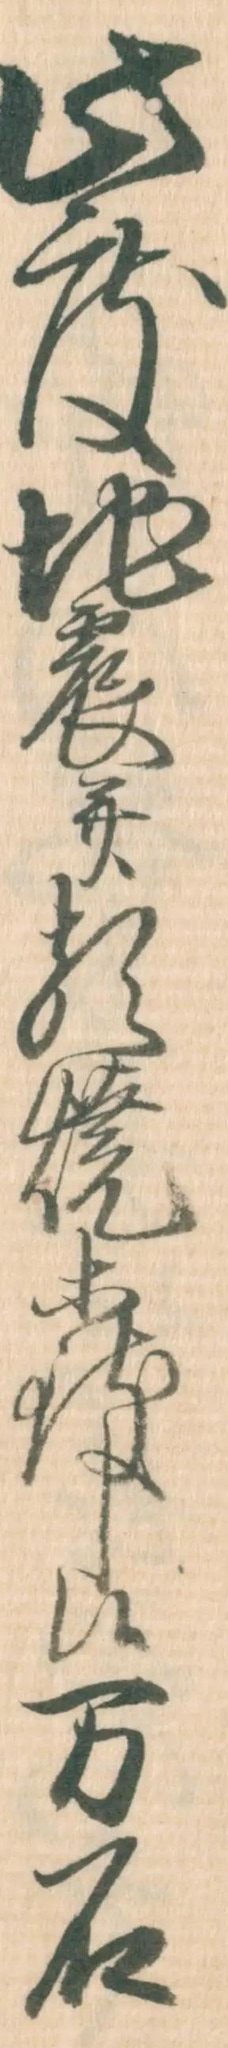此度地震幷類焼等致し候万石
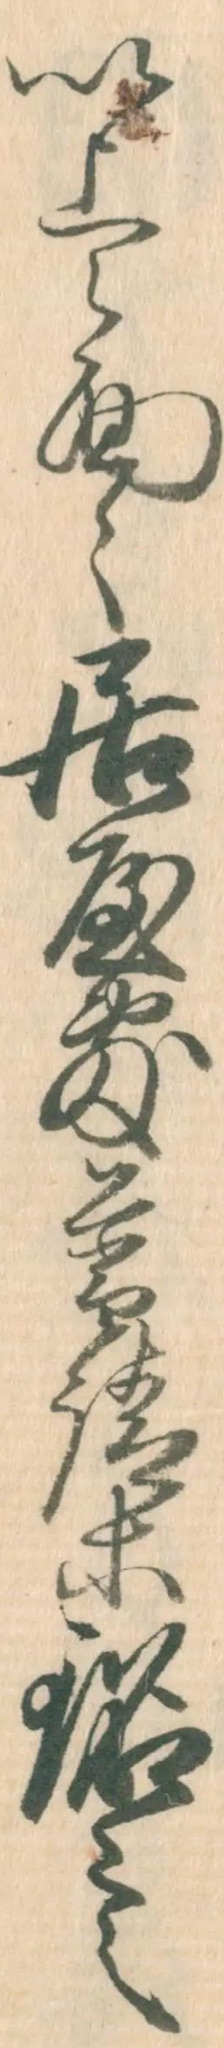以上之面〻居屋敷普請等銘〻之
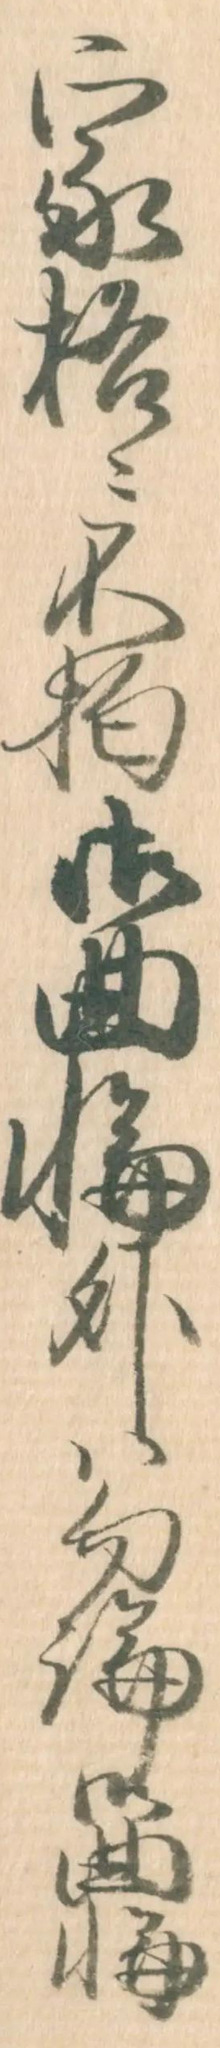家格ニ不拘御曲輪外ハ勿論御曲輪

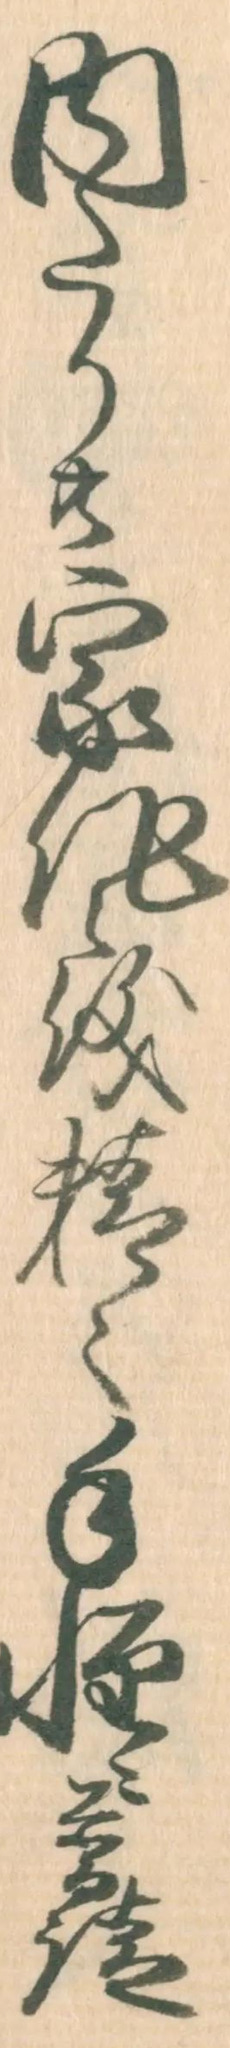内たり共家作之儀精〻手軽ニ普請
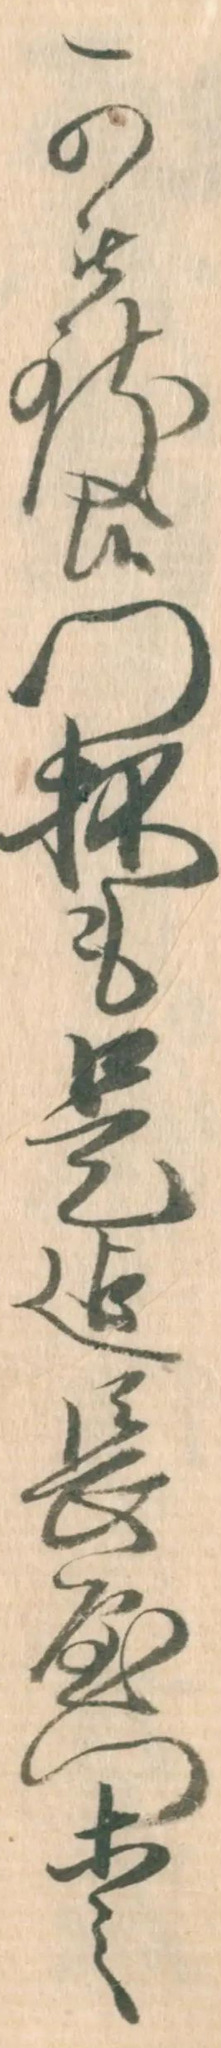可被致候門抔も是迄長屋門等之
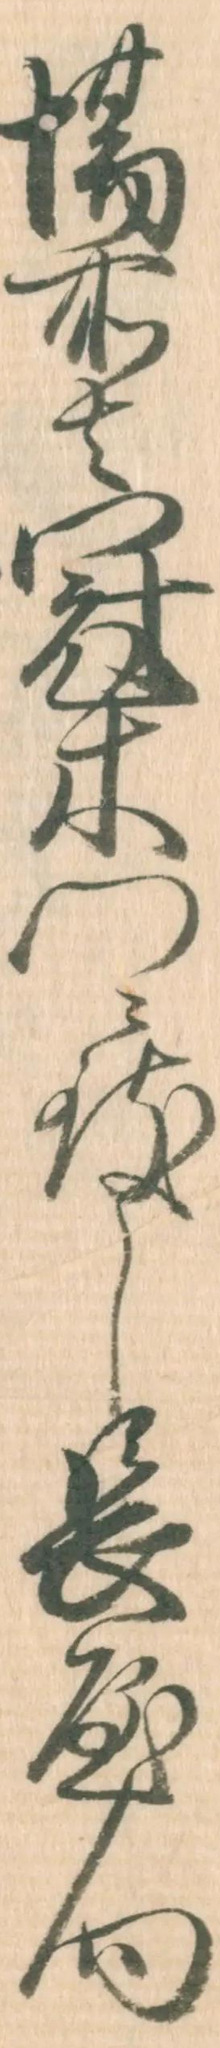場所は冠木門ニ致し長屋向
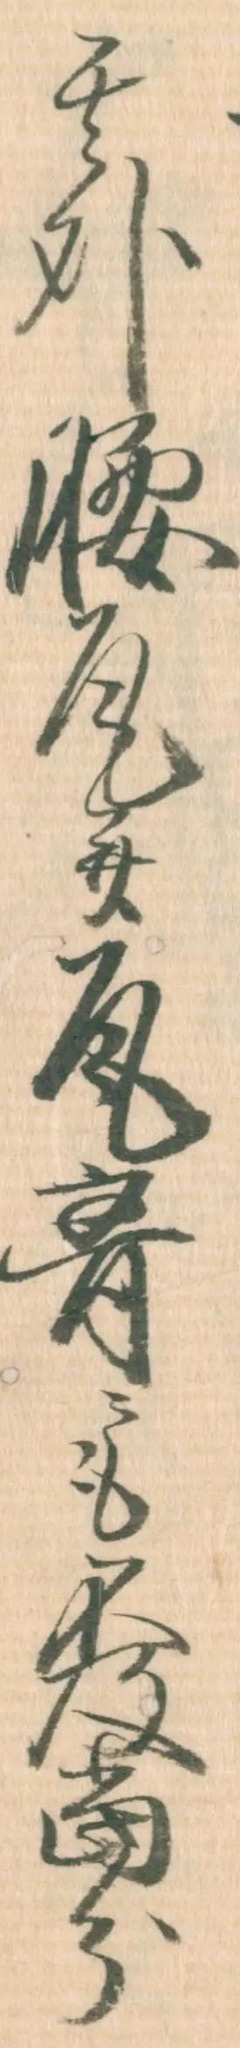其外越瓦幷瓦葺ニも不及当分
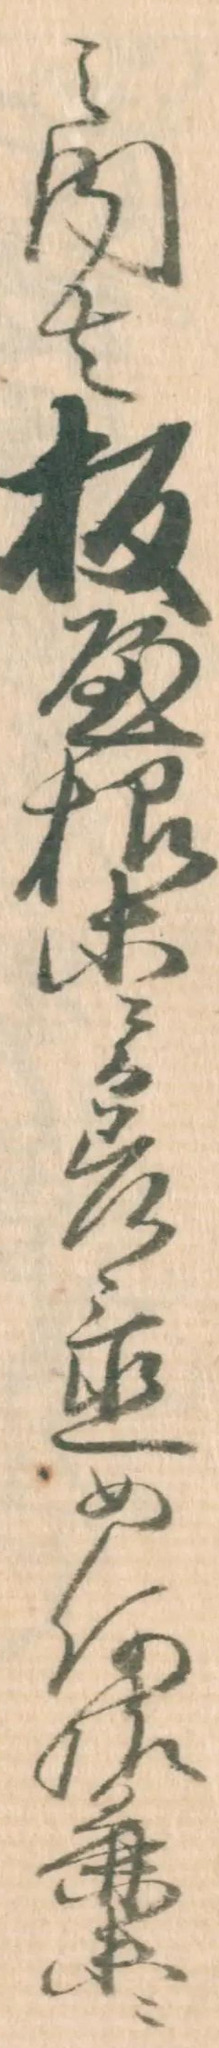之内は板屋根等ニて差置如何様麁末ニ
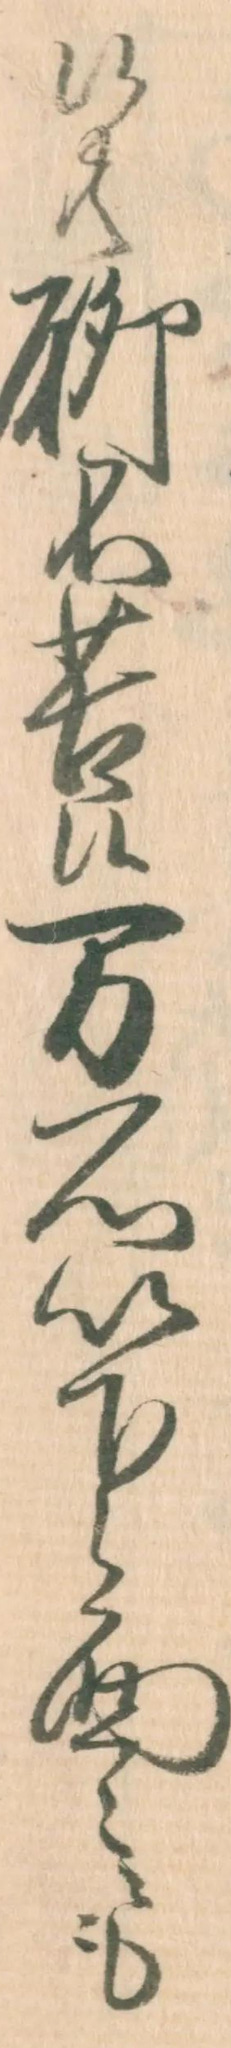候共聊不苦候候万石以下之面〻ニも
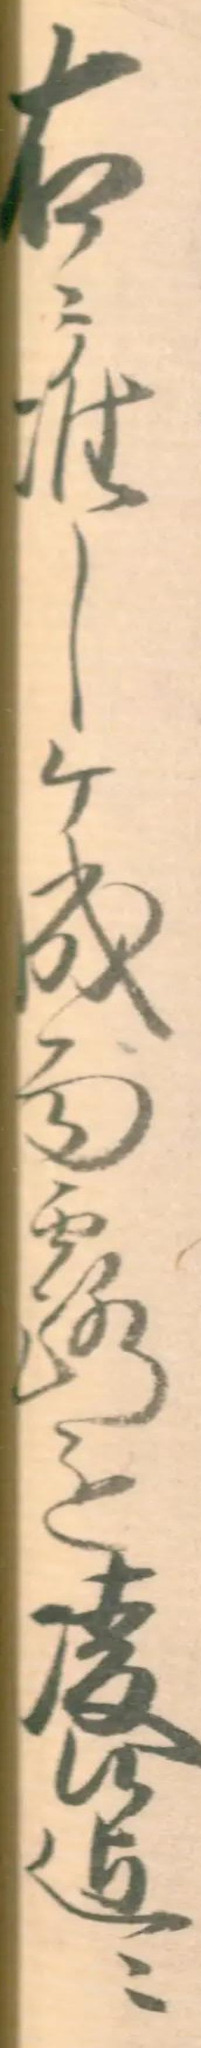右ニ准しケ成雨露を凌候迄ニ
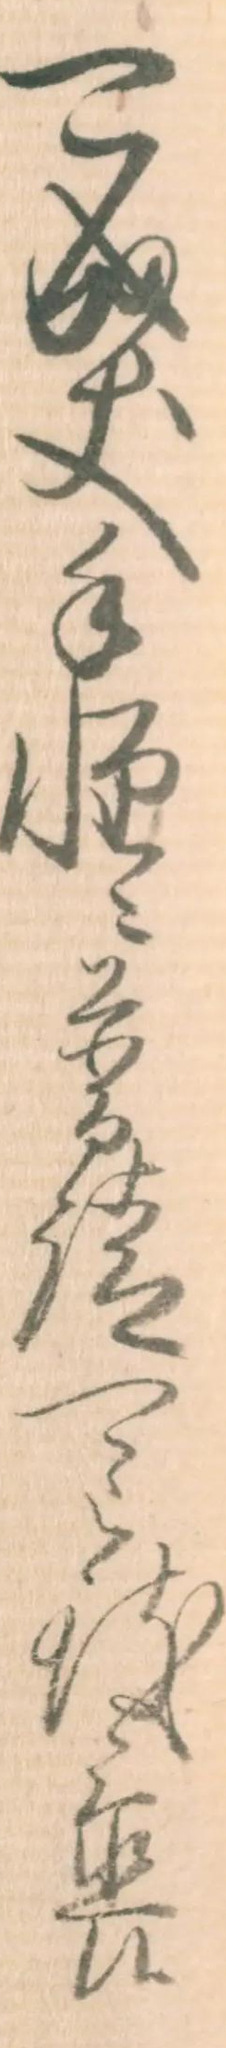可成丈手軽ニ普請可被致置候
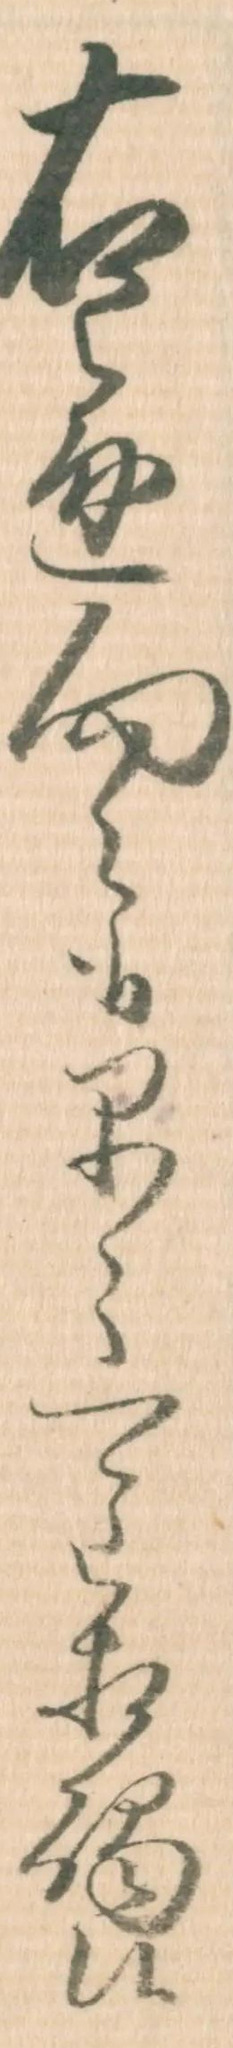右之通向〻え早〻可被相触候
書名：地震災書留 2巻. [2] 内表紙に「地震一件　安政二卯年十月」とあり
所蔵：国立国会図書館 National Diet Library, JAPAN
